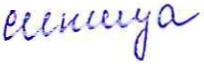синица
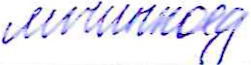личинкоед
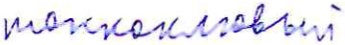тонкоклювый
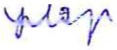улар
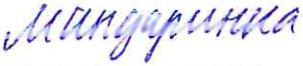мандаринка
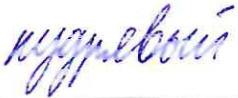кудрявый
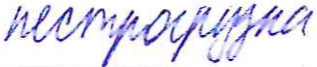пестрогрудка
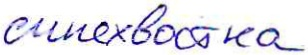синехвостка
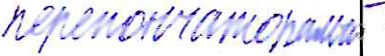перепончатопалый
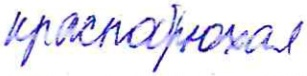краснобрюхая
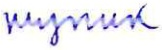тупик
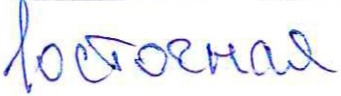восточная
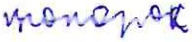топорок
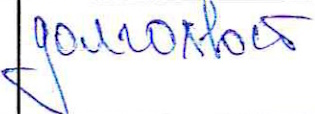долгохвост
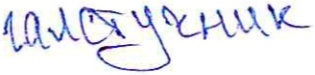галстучник
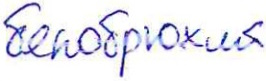белобрюхий
